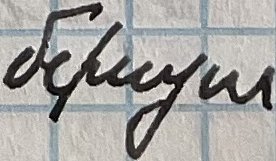беркут
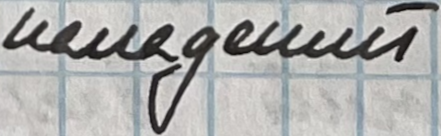канадский
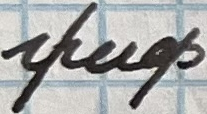гриф
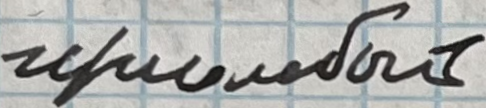чернолобый
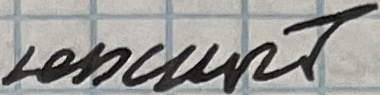южный
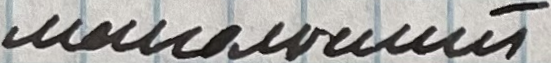монгольский
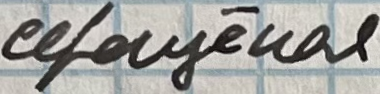серощёкая
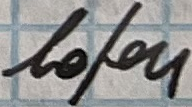ворон
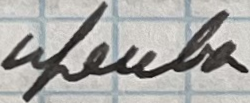кряква
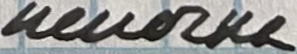пеночка
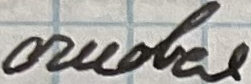очковая
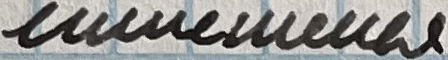египетская
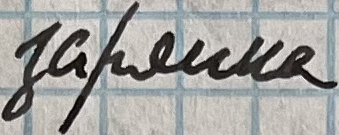зарянка
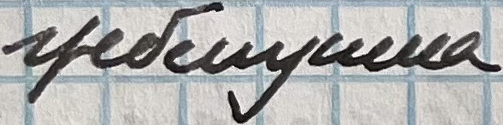гребенушка
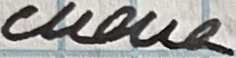скопа
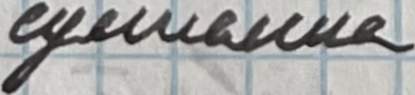султанка
